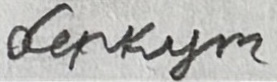беркут
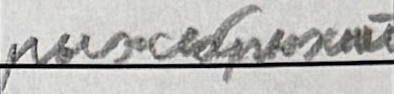рыжебрюхий
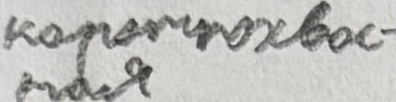короткохвос-тая
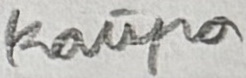кайра
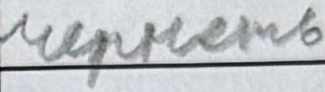чернеть
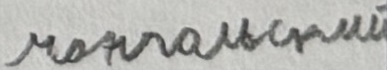монгальский
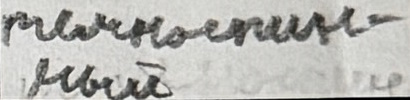темноспин-ный
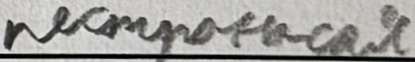пестроносая
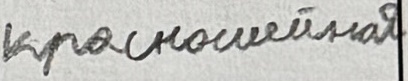красношейная
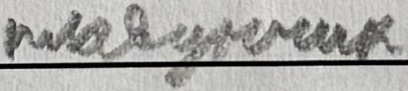плавунчик
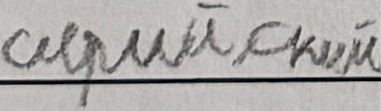сирийский
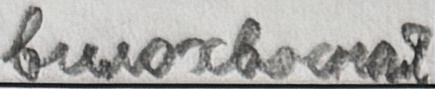вилохвостая
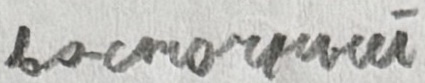восточный
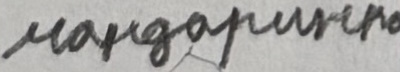мандаринко
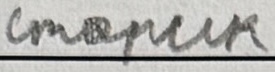старик
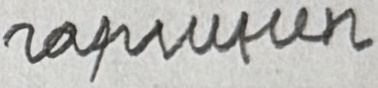гаршнеп
